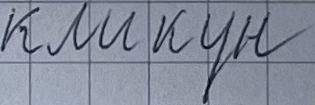кликун
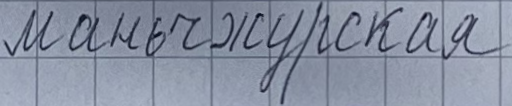маньчжурская
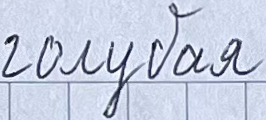голубая
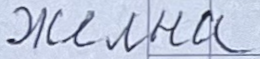желна
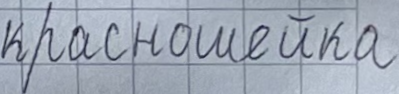красношейка
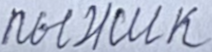пыжик
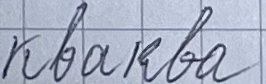кваква
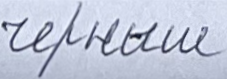черныш
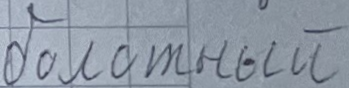болотный
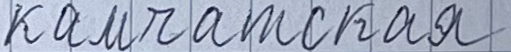камчатская
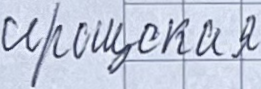серощекая
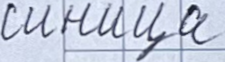синица
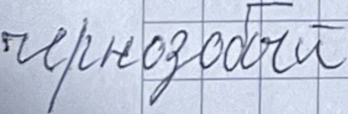чернозобый
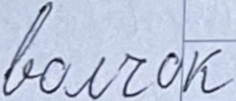волчок
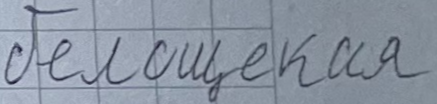белощёкая
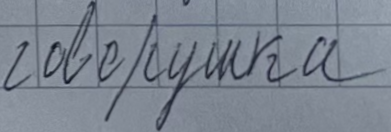говорушка
